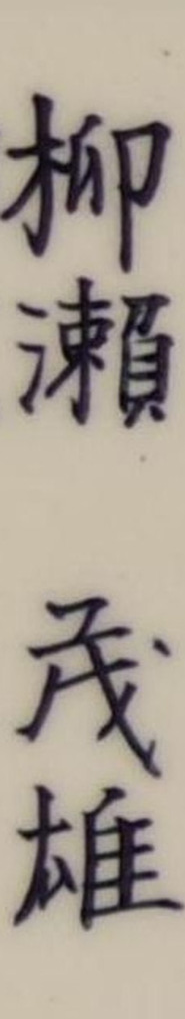柳瀬茂雄
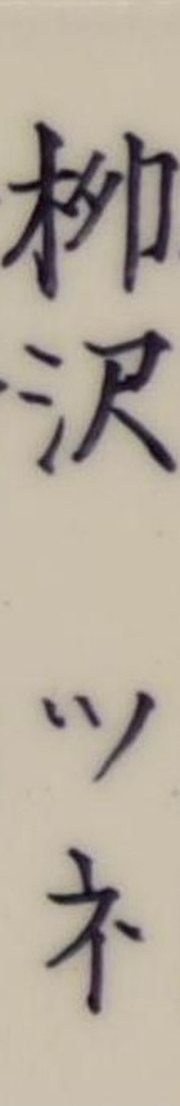柳沢ツネ
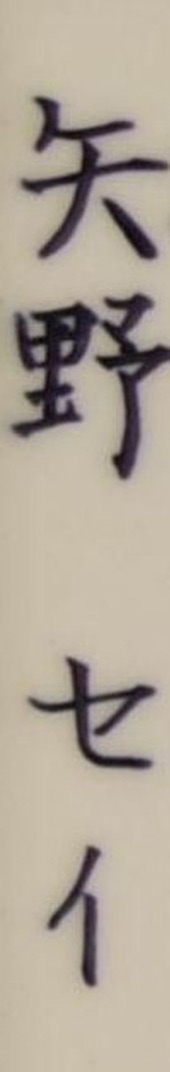矢野セイ

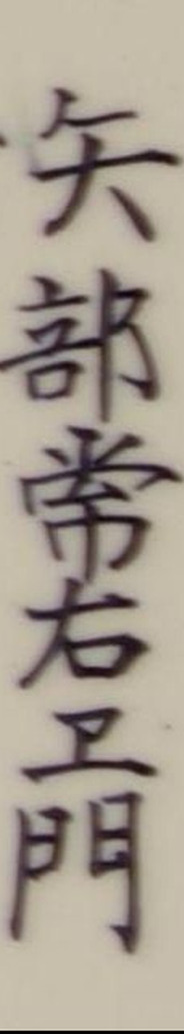矢部常右ヱ門
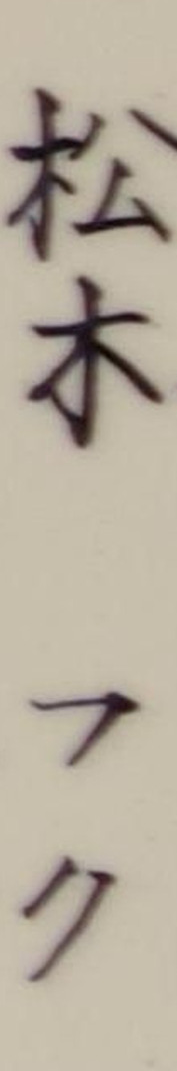松木フク
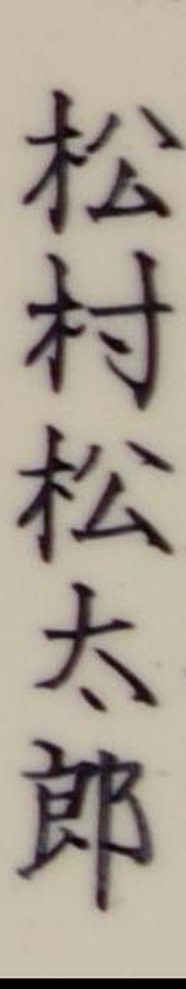松村松太郎
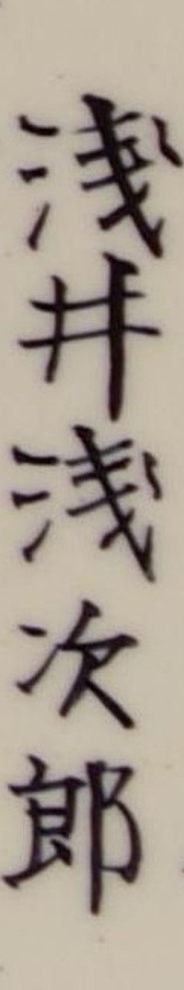浅井浅次郎
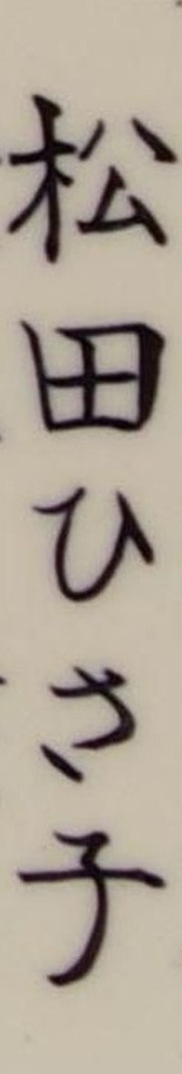松田ひさ子
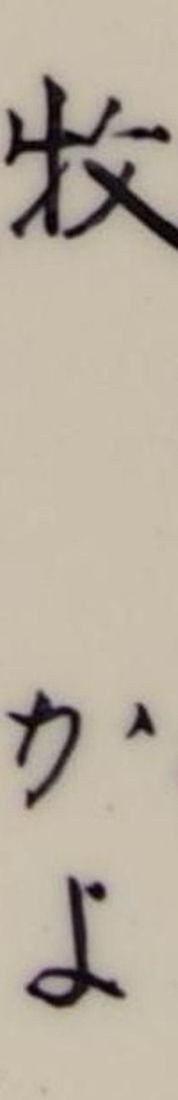牧かよ
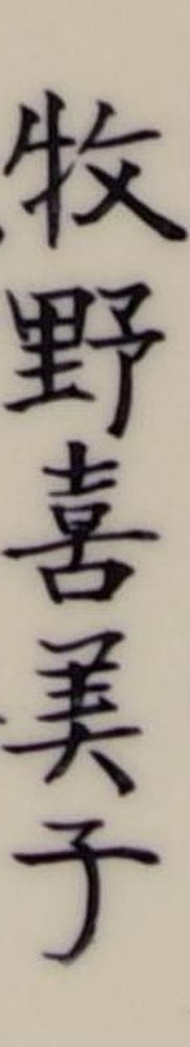牧野喜美子
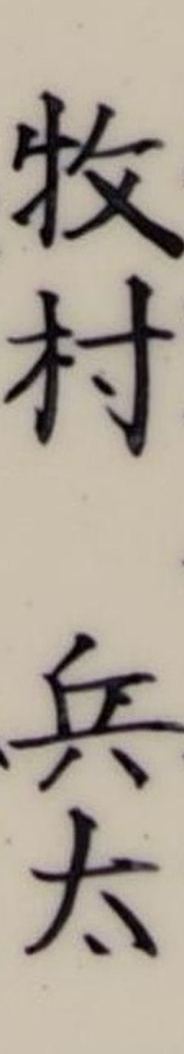牧村兵太
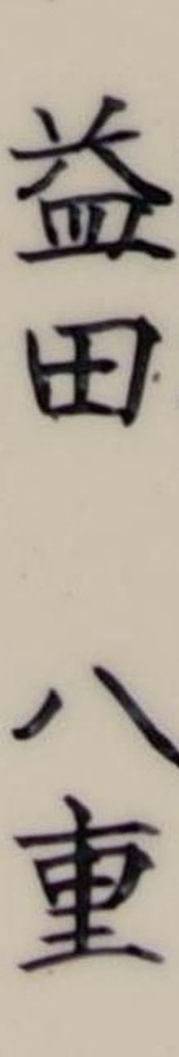益田八重
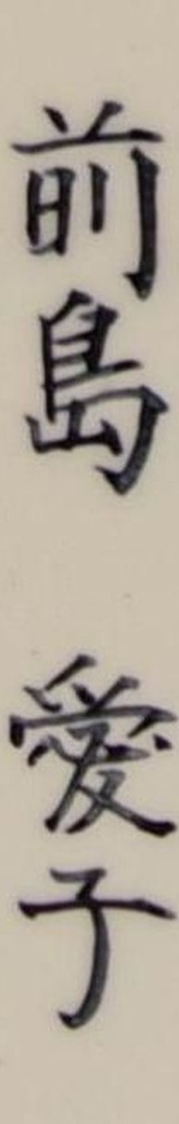前島愛子
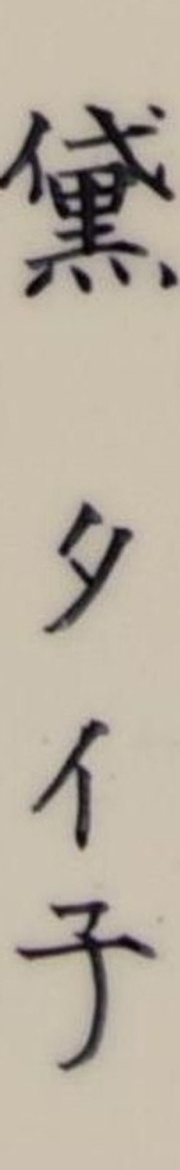黛タイ子
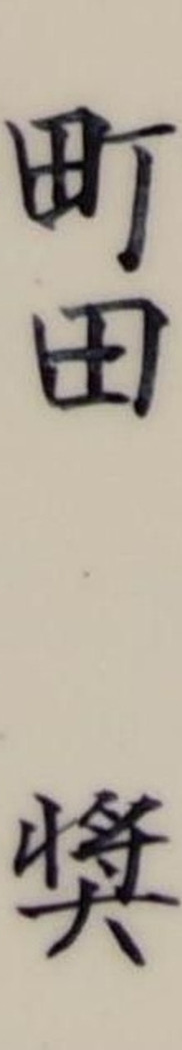町田奨
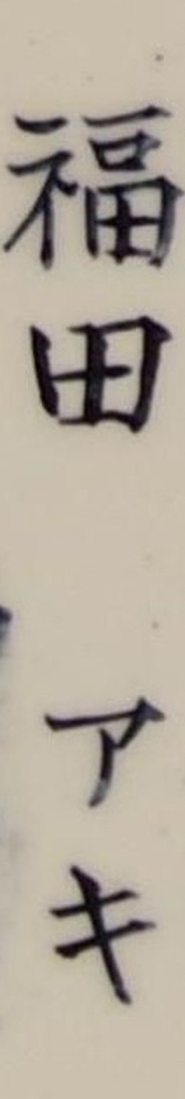福田アキ
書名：E~L
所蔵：高野山金剛峯寺
